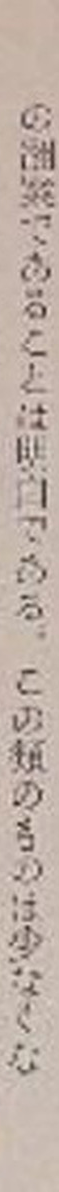の翻案であることは明白である。この類のものは少なくな
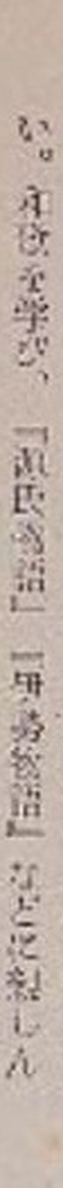い。和歌を学び、『源氏物語』『伊勢物語』などに親しん
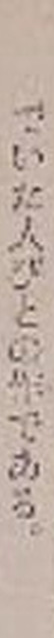でいた人びとの作である。
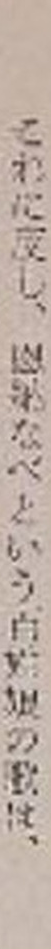これに反し、恩納なべという百姓娘の歌は、
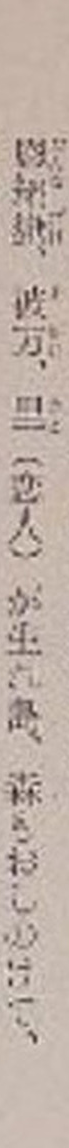恩納嶽、彼方、里(恋人)が生れ島、森もおしのけて、
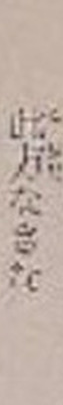此方なさな
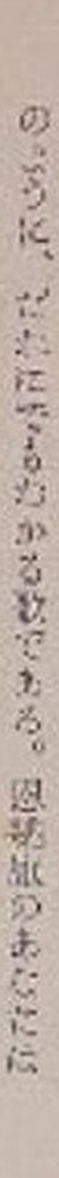のように、だれにでもわかる歌である。恩納嶽のあなたは
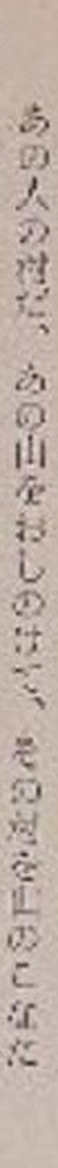あの人の村だ、あの山をおしのけて、その村を山のこなた
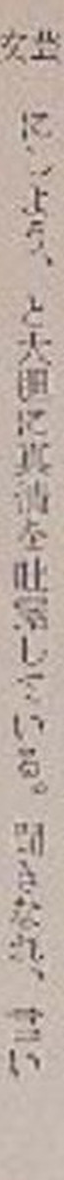にしよう、と大胆に真情を吐露している。聞きなれ、言い
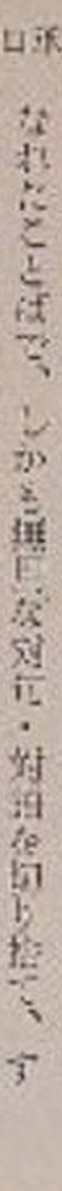なれたことばで、しかも無用な対句・対語を切り捨て、す
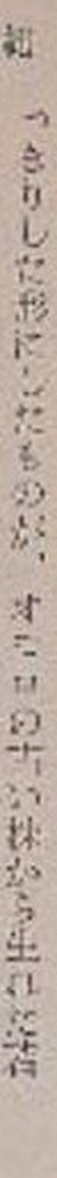っきりした形にしたものが、オモロの古い株から生れた若
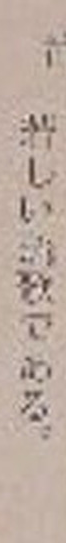若しい琉歌である。
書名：沖縄口承文芸
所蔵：University of the Ryukyus Library
